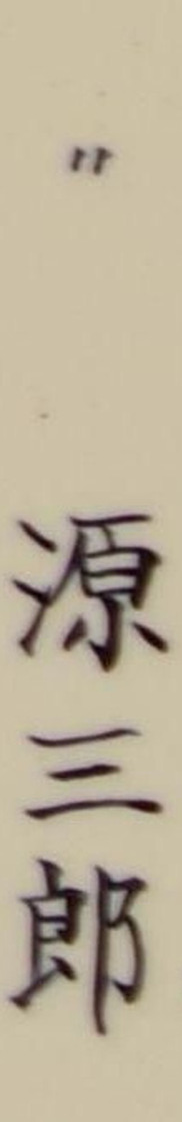源三郎
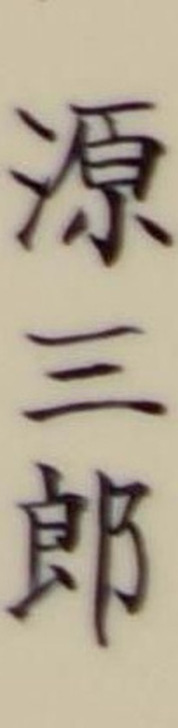源三郎
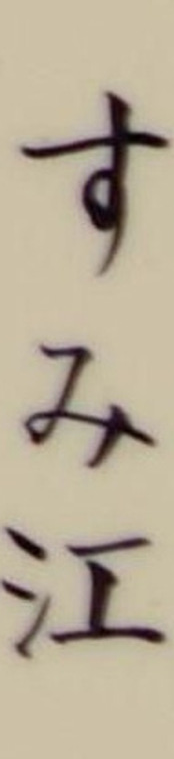すみ江
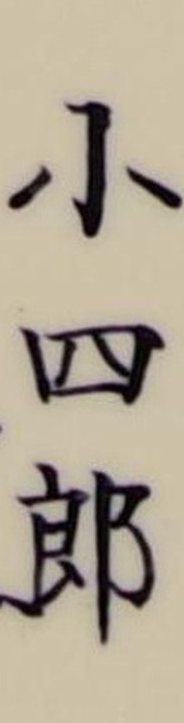小四郎
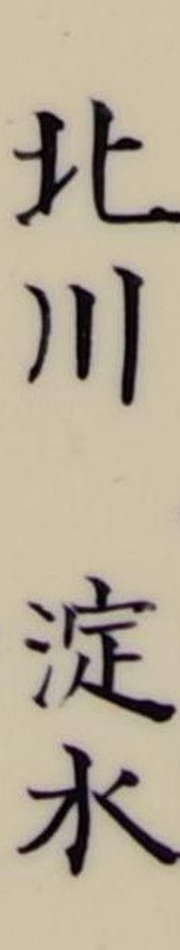北川淀水
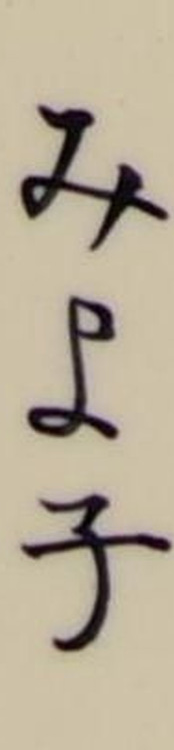みよ子
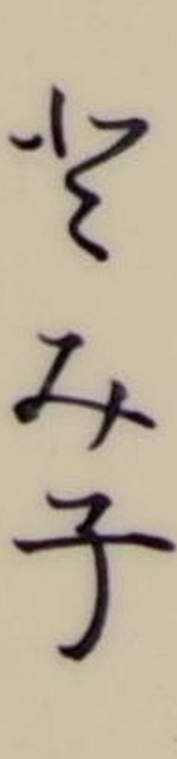とみ子
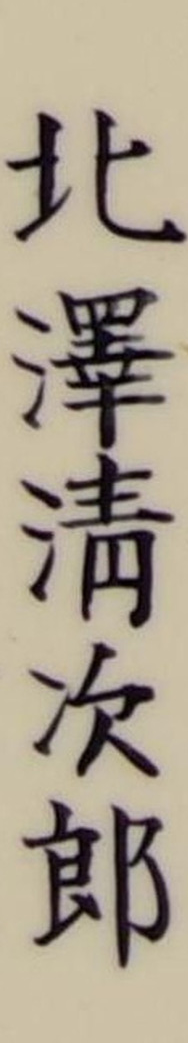北澤清次郎
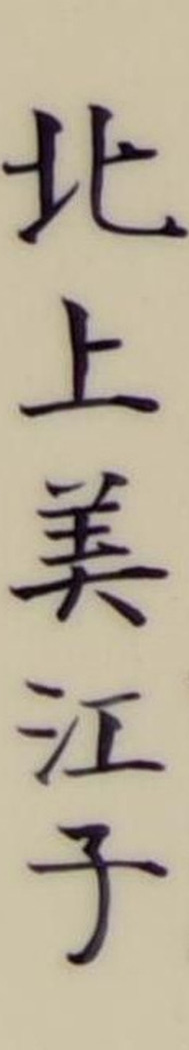北上美江子
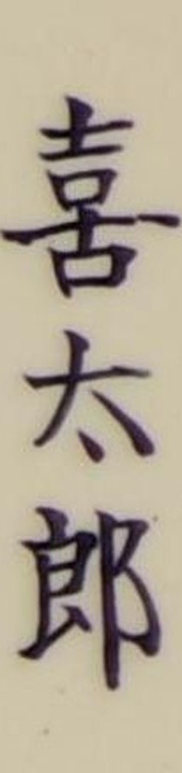喜太郎
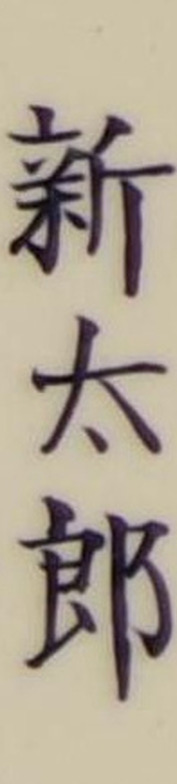新太郎
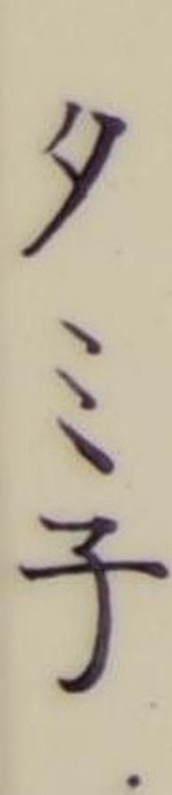タミ子

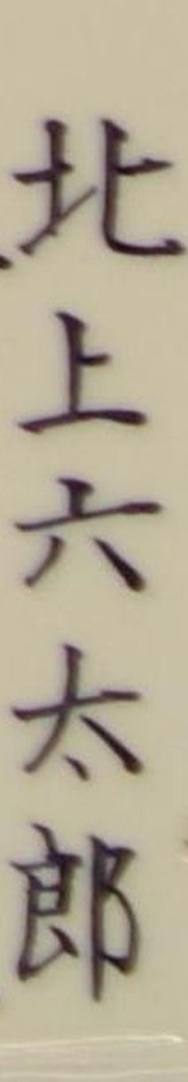北上六太郎
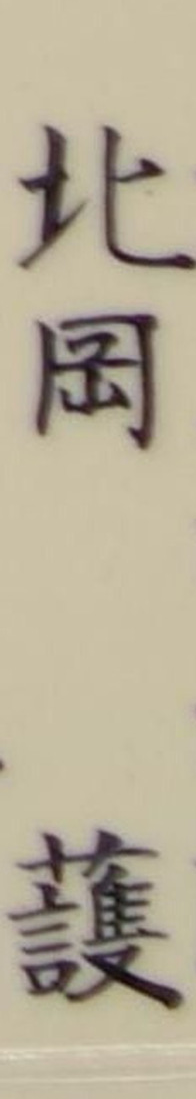北岡護
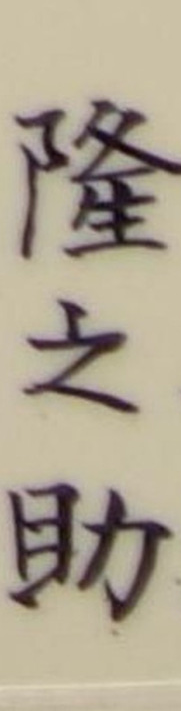隆之助
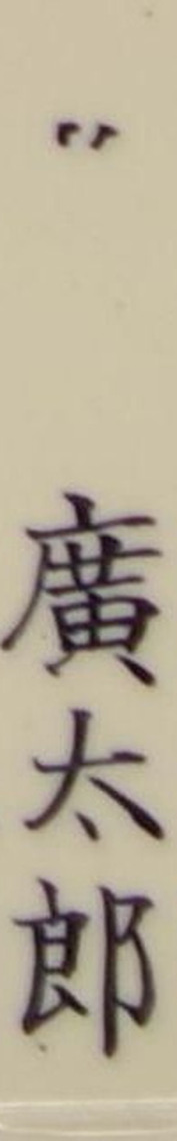廣太郎
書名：E~L
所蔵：高野山金剛峯寺
